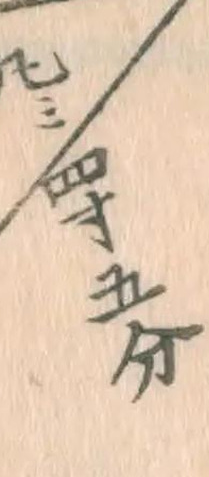丸み四寸五分
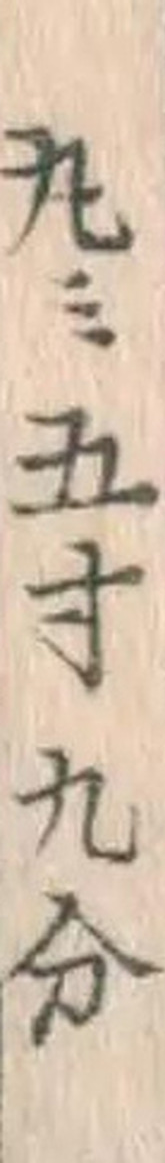丸み五寸九分
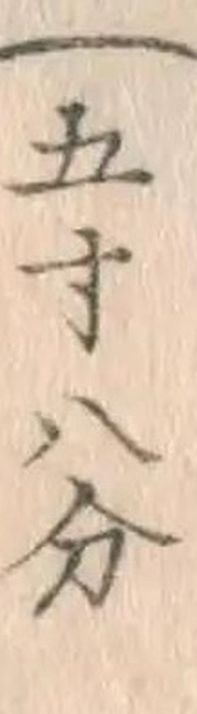五寸八分
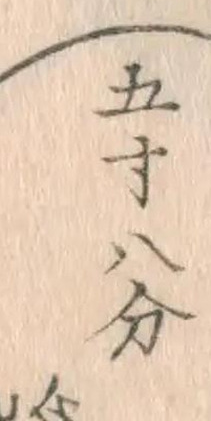五寸八分
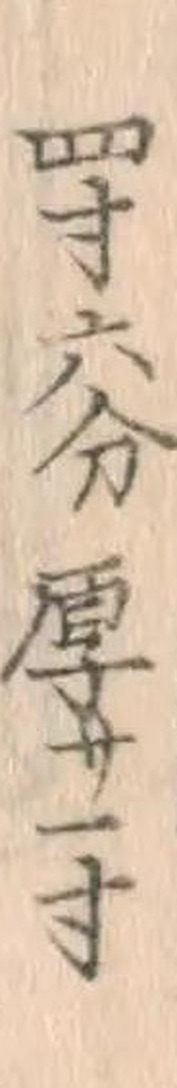四寸六分厚さ一寸
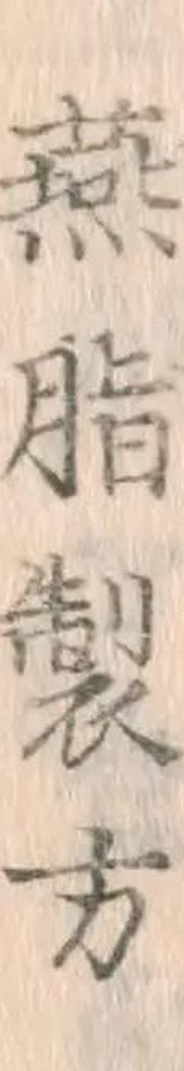燕脂製方
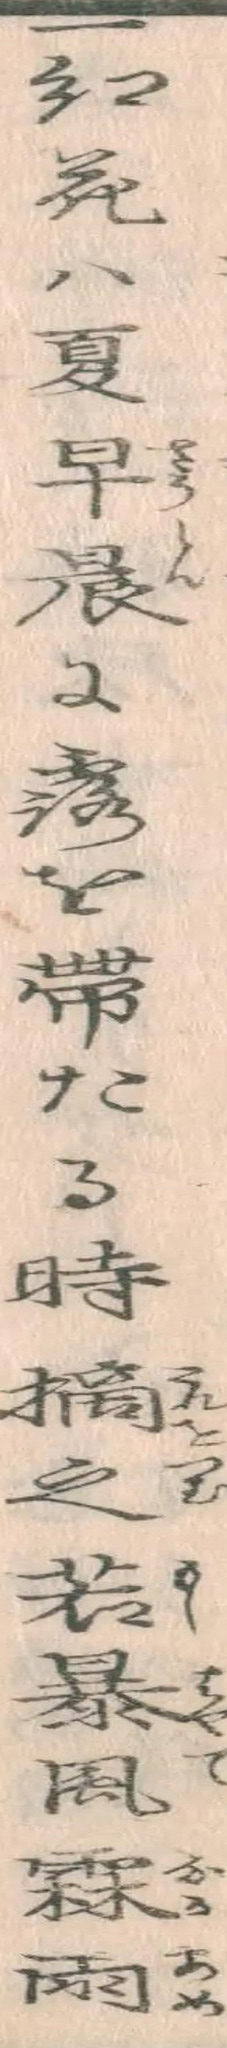一紅花は夏早晨に露を帯たる時摘之若暴雨霖雨
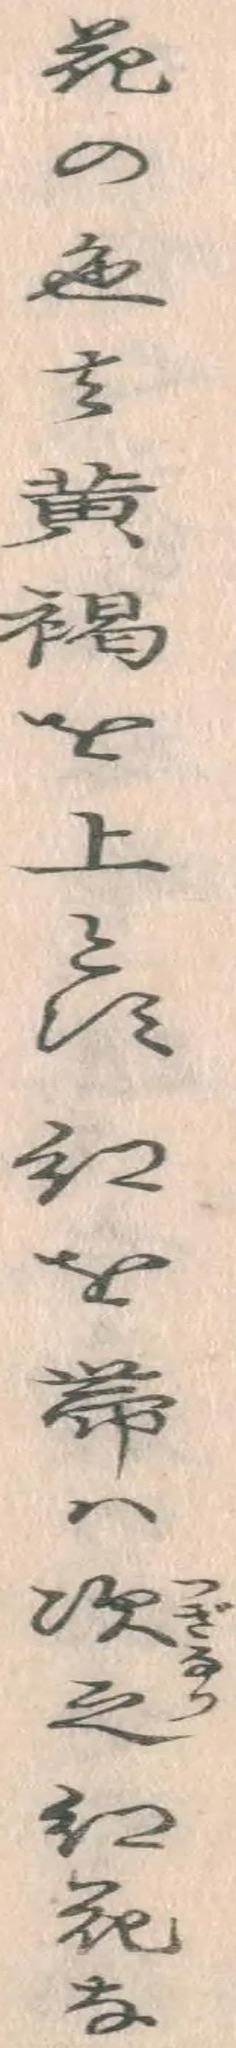花の色は黄褐を上とす紅を帯は次之紅花な
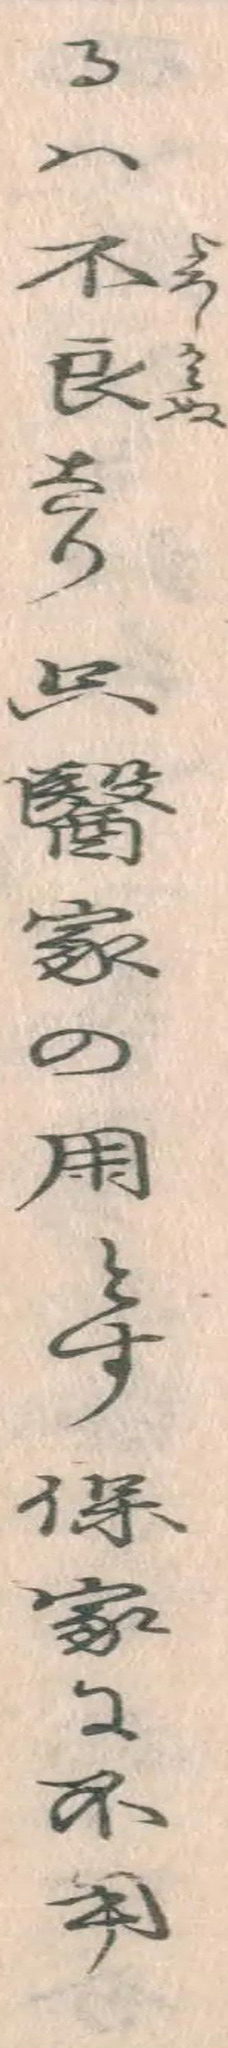るは不良なり只医家の用とす保家に不用
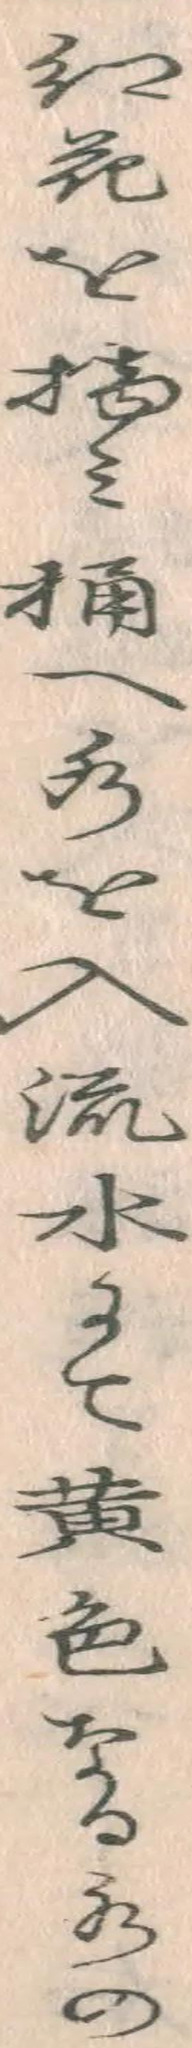一紅花を摘み桶へ水を入流水にて黄色なる水の
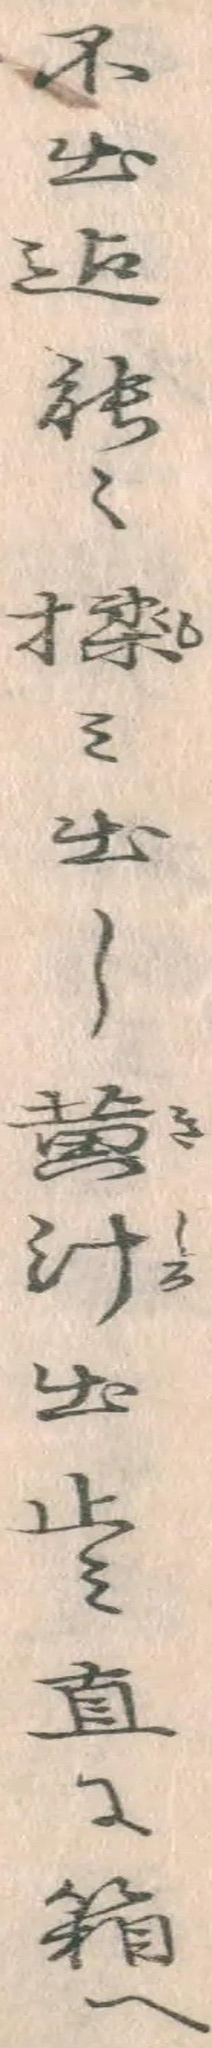不出迄能く揉み出し黄汁出止み直に箱へ
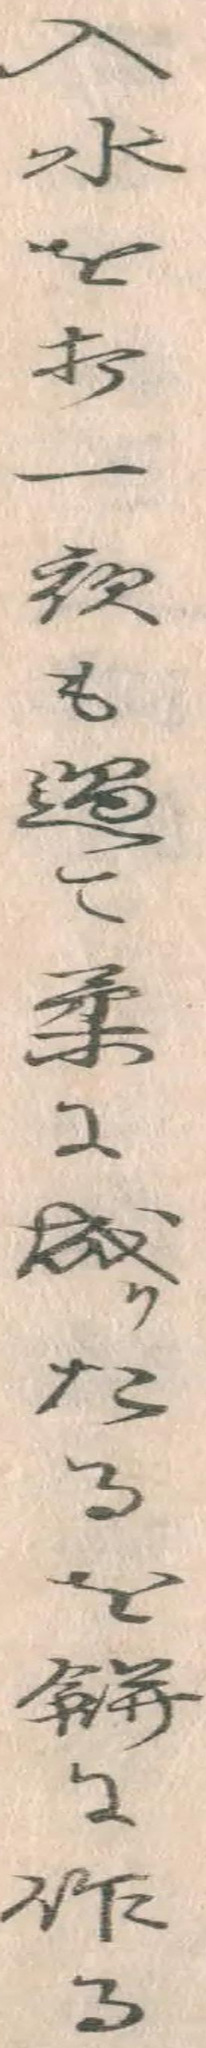入水を打一夜も過て柔に成りたるを餅に作る
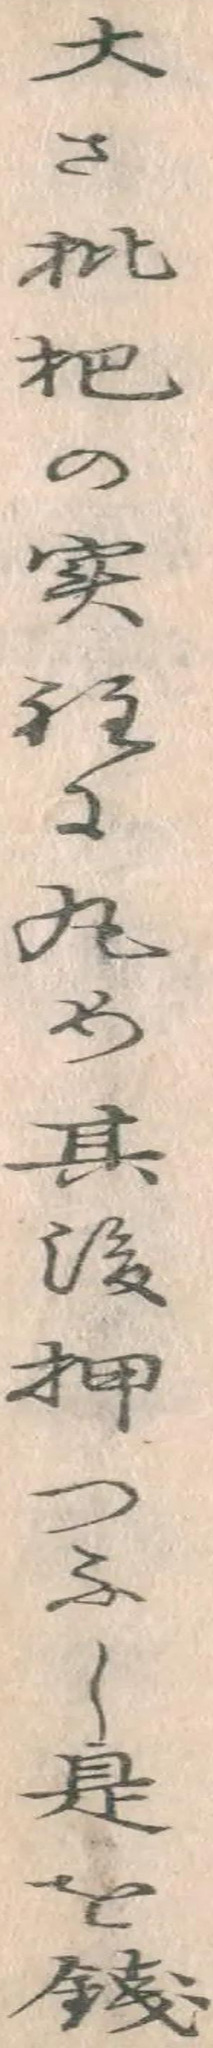大さ枇杷の実程に丸め其後押つふし是を銭
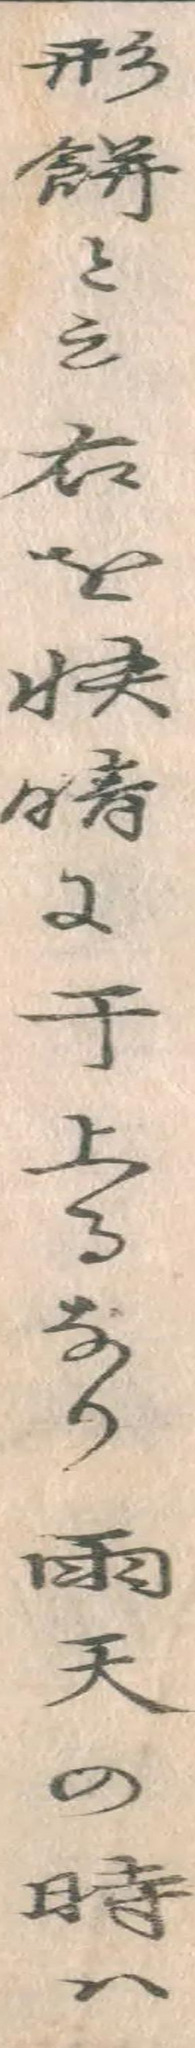形餅と云右を快晴に干上るなり雨天の時は
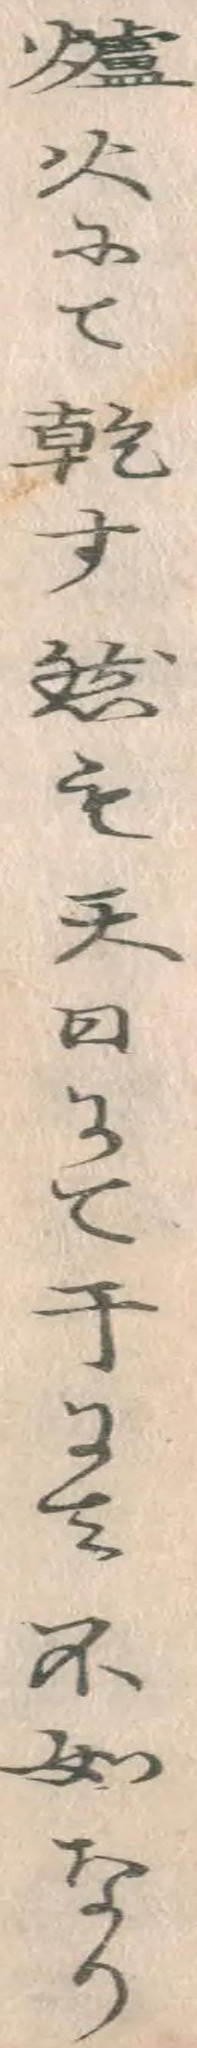炉火にて乾す然も天日にて干には不如なり
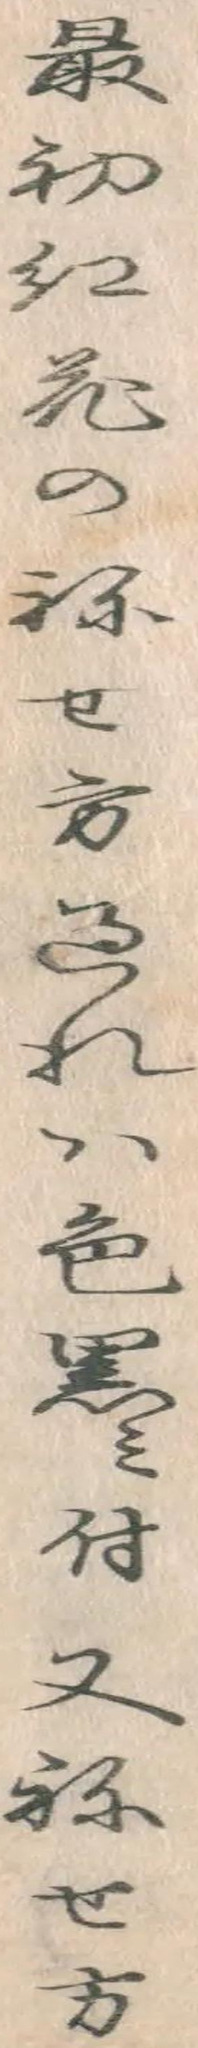最初紅花のねせ方過れは色黒み付又ねせ方
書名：機織彙編 5巻. [1]
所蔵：国立国会図書館 National Diet Library, JAPAN
